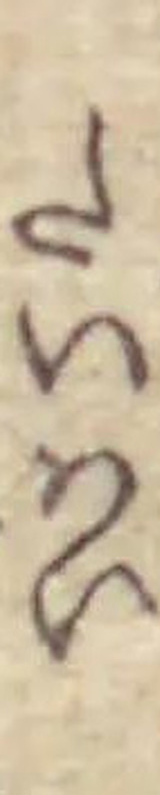たいはい
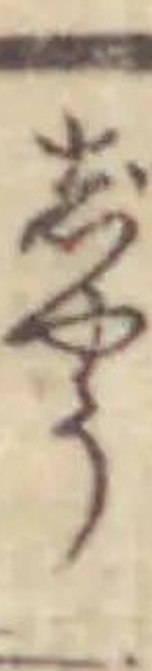じやう
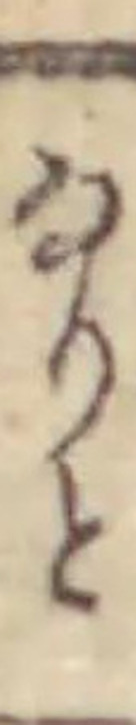るりと
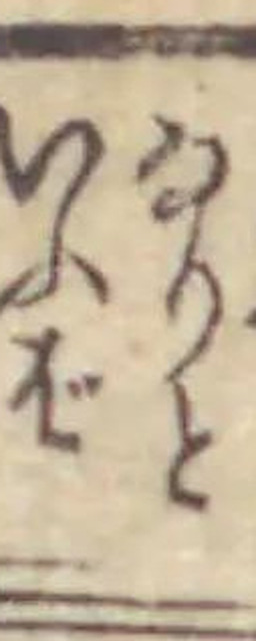いふば
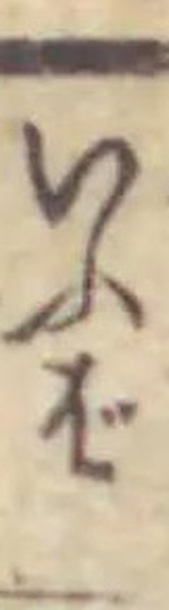いふば
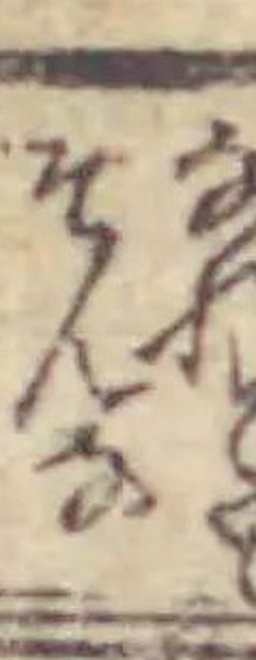そんな
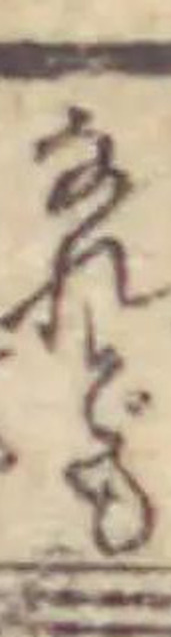なれども
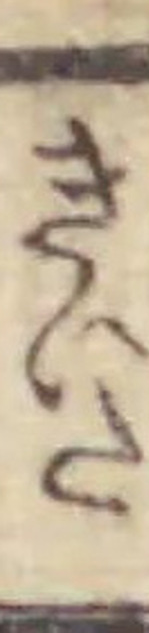きいた
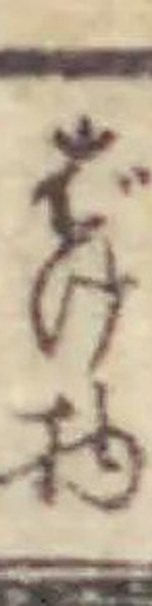ばけ物
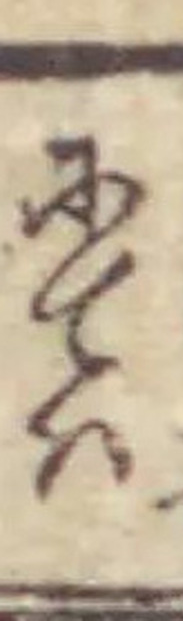にては
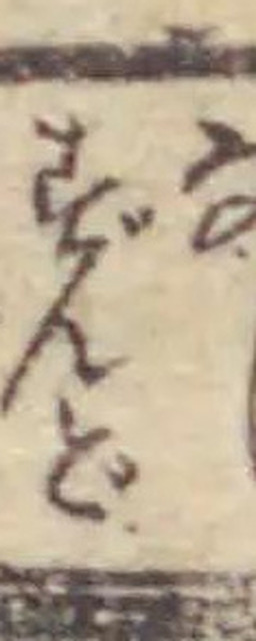ずんど
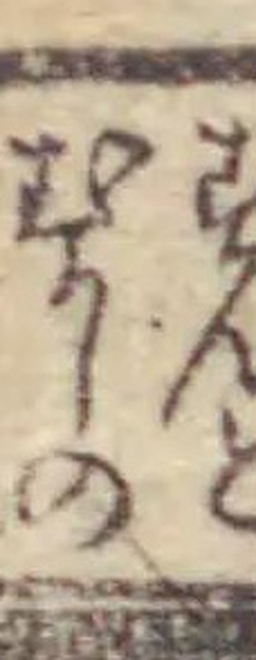むかしの
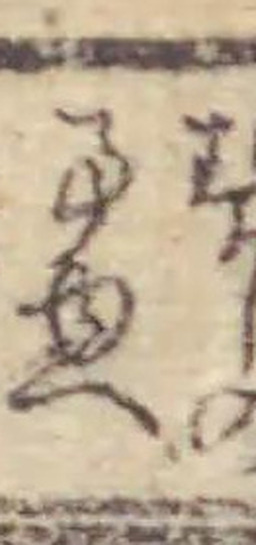事ゆへ
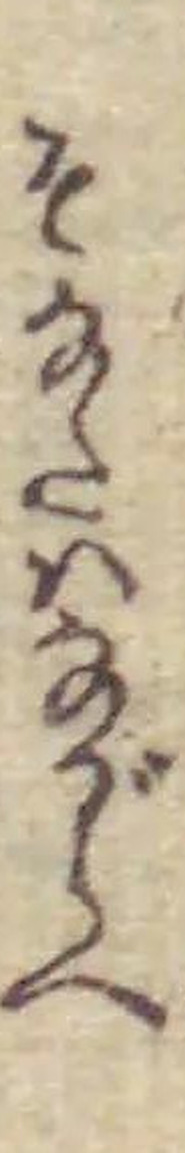そなたはながらへ
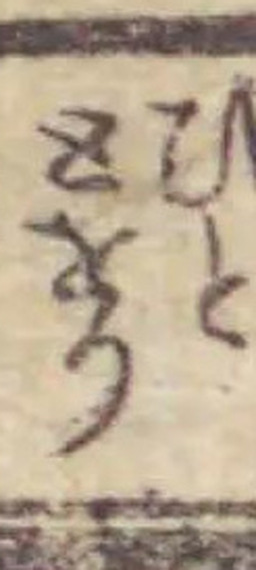とをり
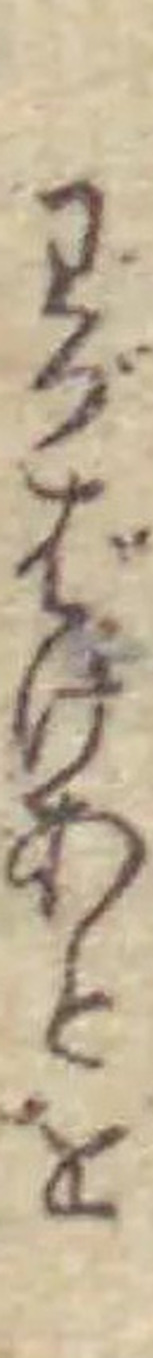わがばけあとを
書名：大昔化物双紙 2巻
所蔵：国立国会図書館 National Diet Library, JAPAN
